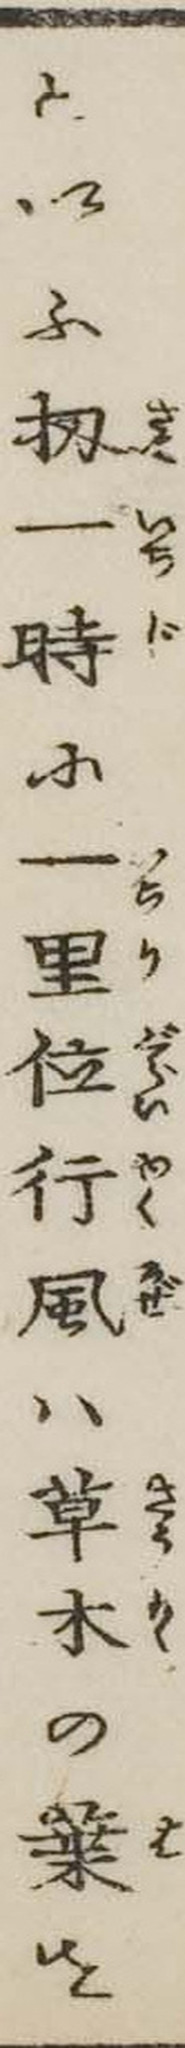といふ扨一時に一里位行風は草木の葉を
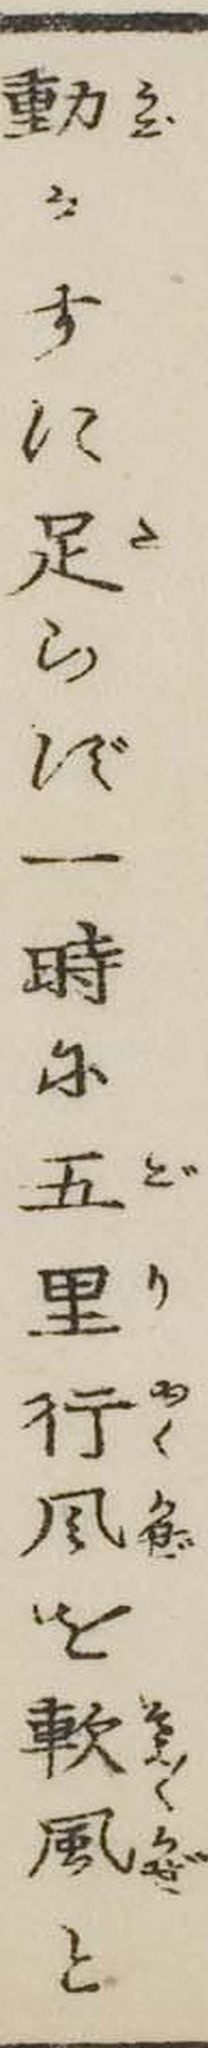動かすに足らず一時に五里行風を軟風と
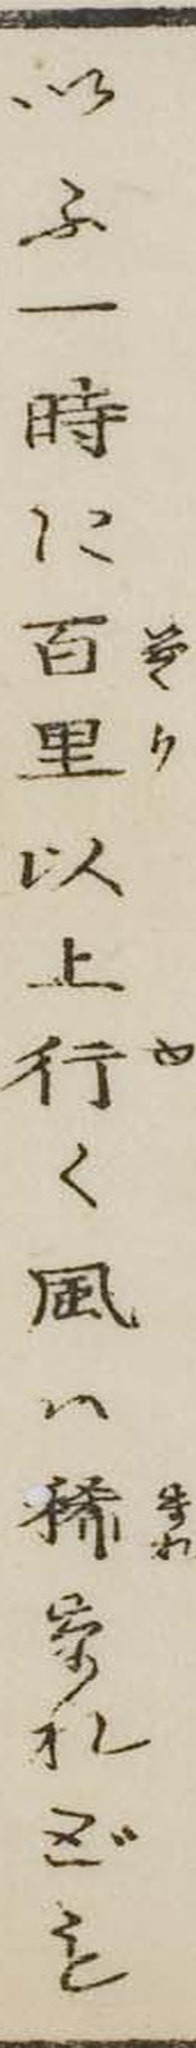いふ一時に百里以上行く風は稀なれども
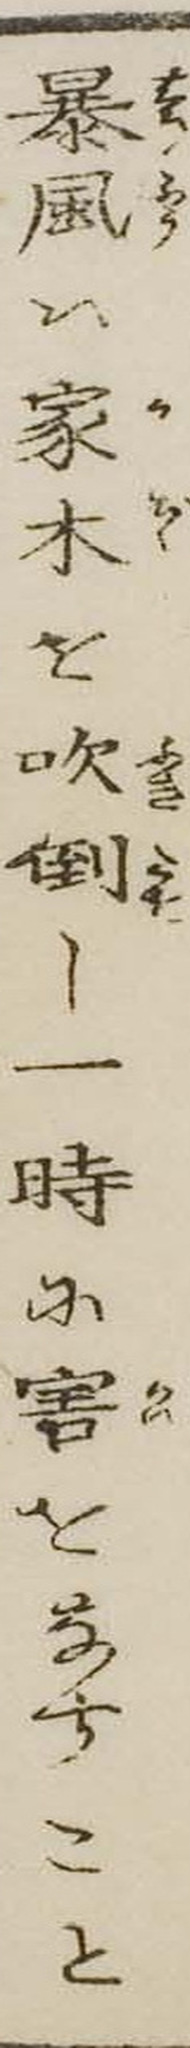暴風は家木を吹倒し一時に害をなすこと
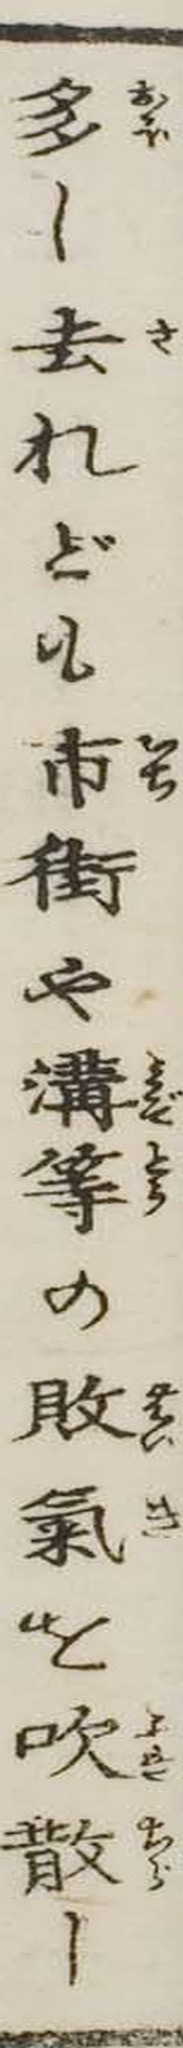多し去れども市街や溝等の敗氣を吹散し
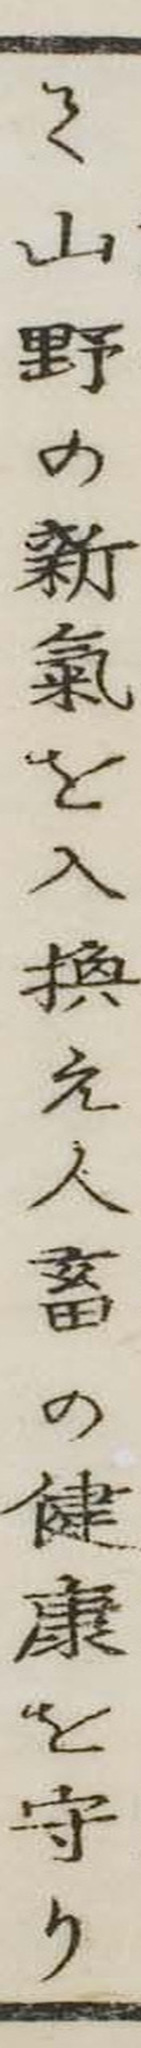て山野の新氣を入換え人畜の健康を守り
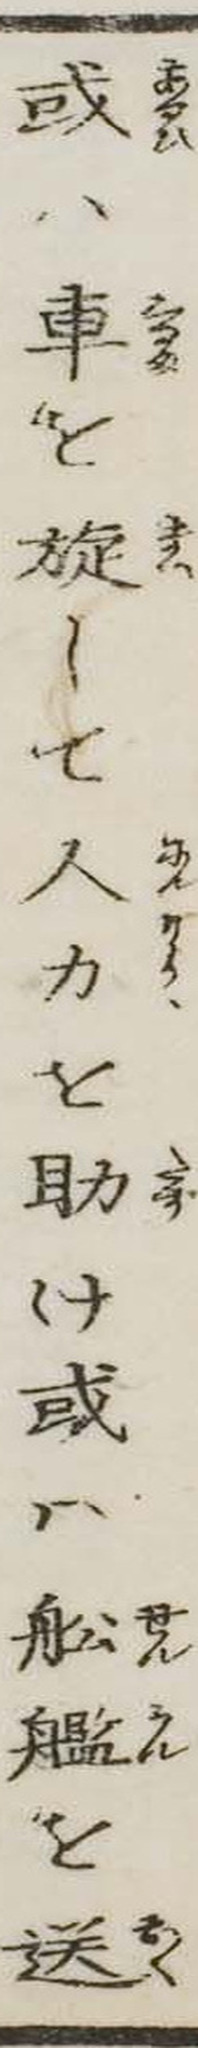或は車を旋して人力を助け或は舩艦を送
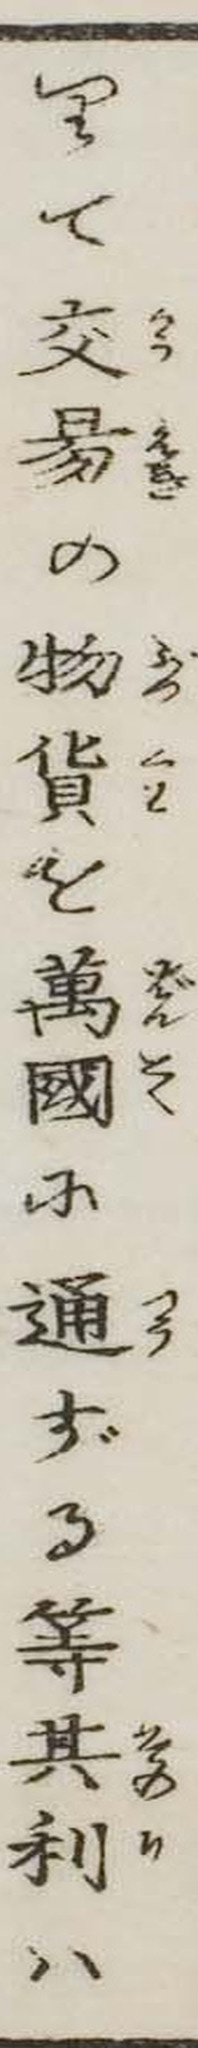りて交易の物貨を萬國に通ずる等其利は
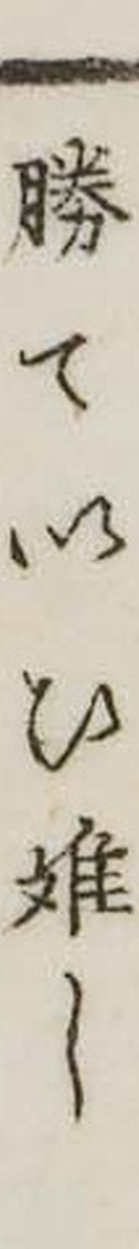勝ていひ难し
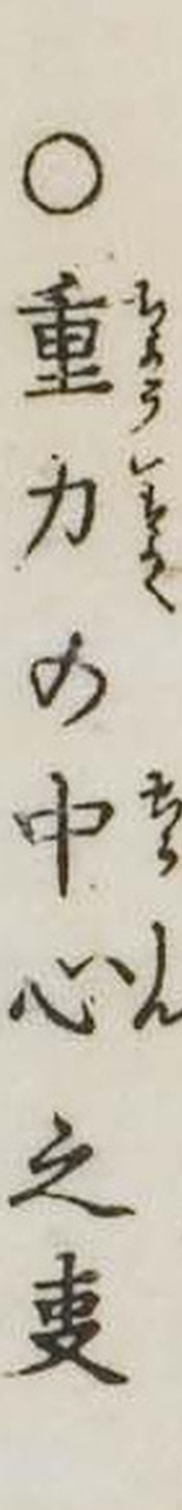◯重力の中心之叓
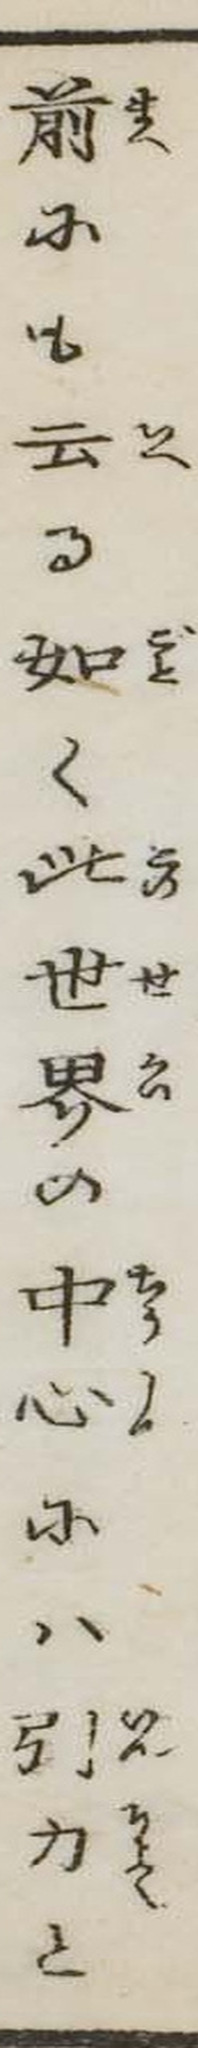前にも云る如く此世界の中心には引力と
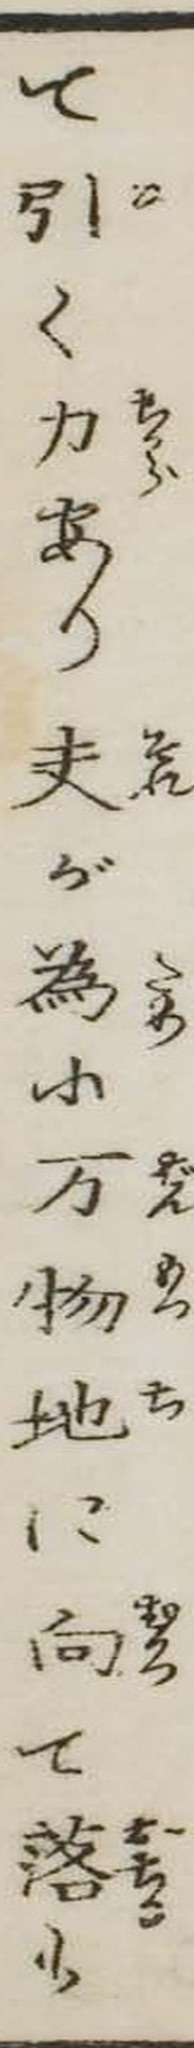て引く力あり夫が為に万物地に向て落も

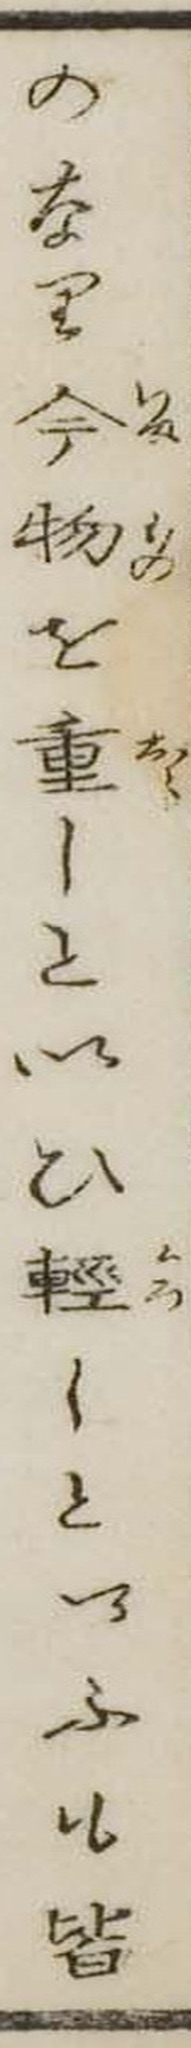のなり今物を重しといひ輕しといふも皆
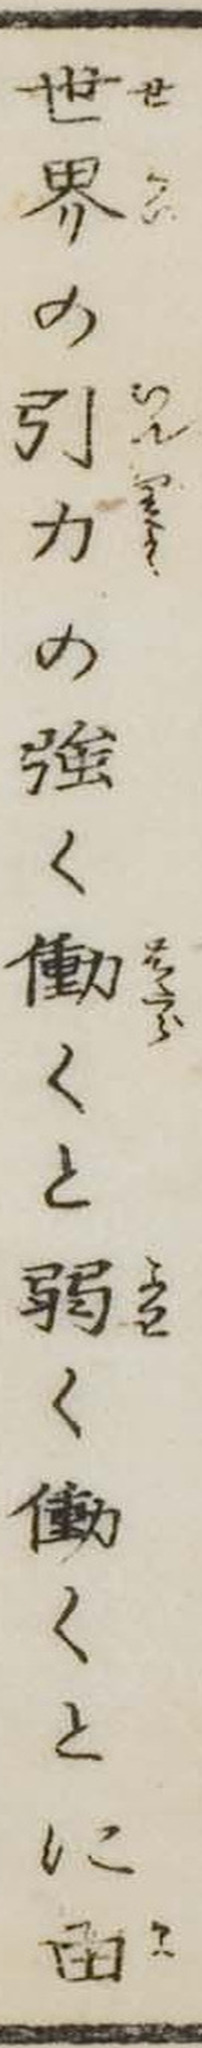世界の引力の強く働くと弱く働くとに由
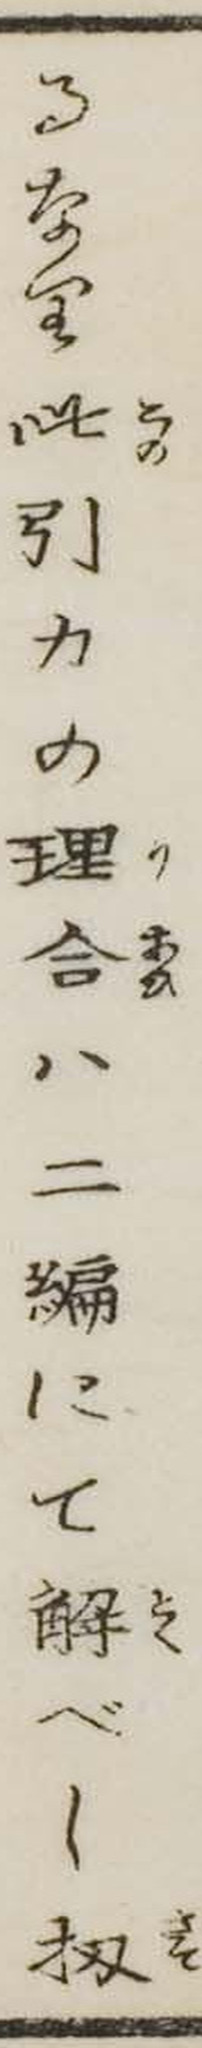るなり此引力の理合は二編にて解べし扨
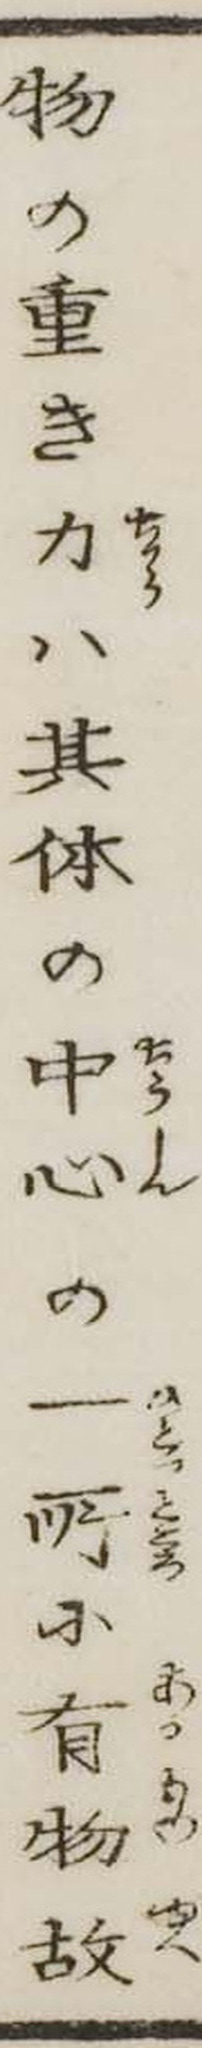物の重き力は其体の中心の一所に有物故
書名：究理知慧の勧 : 訓蒙画入 巻之2
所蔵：東京学芸大学附属図書館
